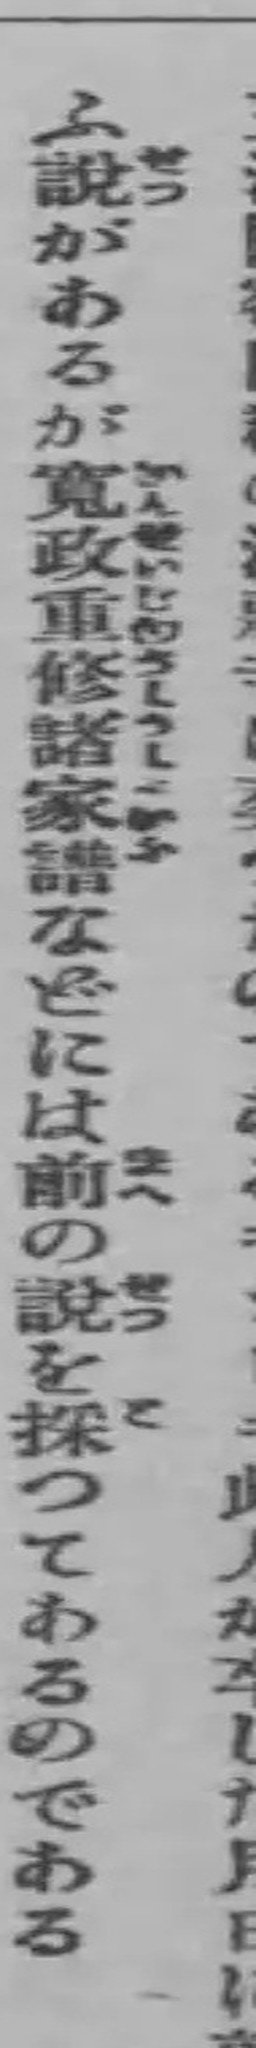ふ説があるが寛政重修諸家譜などには前の説を採つてあるのである
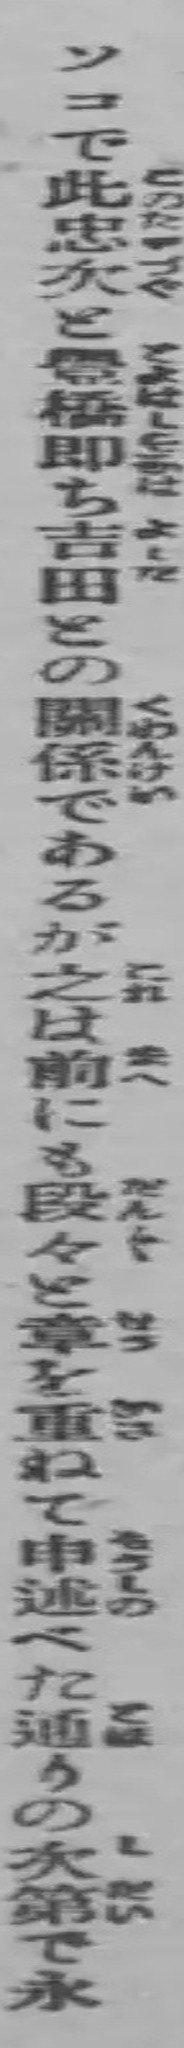忠次と吉田ソコで此忠次と豊橋即ち吉田との関係であるが之は前にも段々と章を重ねて申述べた通りの次第で永
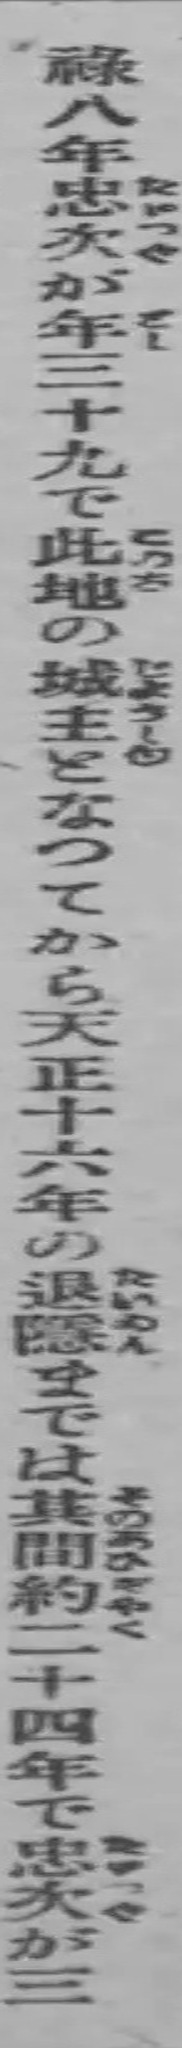禄八年忠次が年三十九でこの此地の城主となつてから天正十六年の退隠までは其間約二十四年で忠次が三
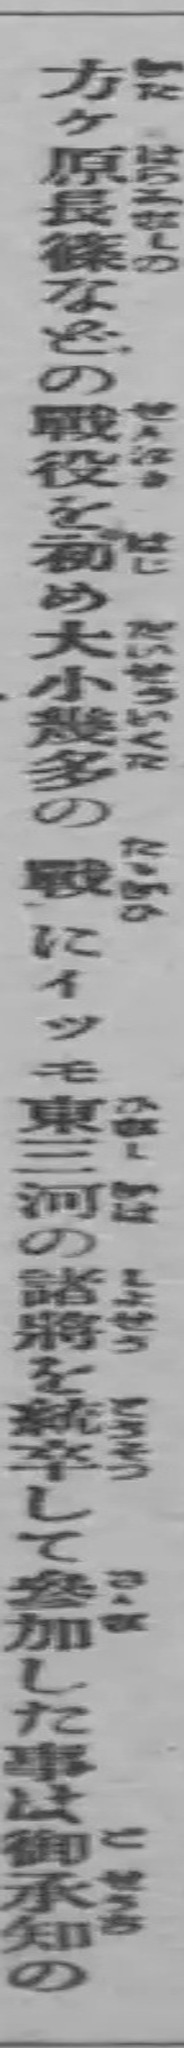方ケ原長篠などの戦役を初め大小幾多の戦にイツモ東三河の諸将を統率して参加した事は御承知の
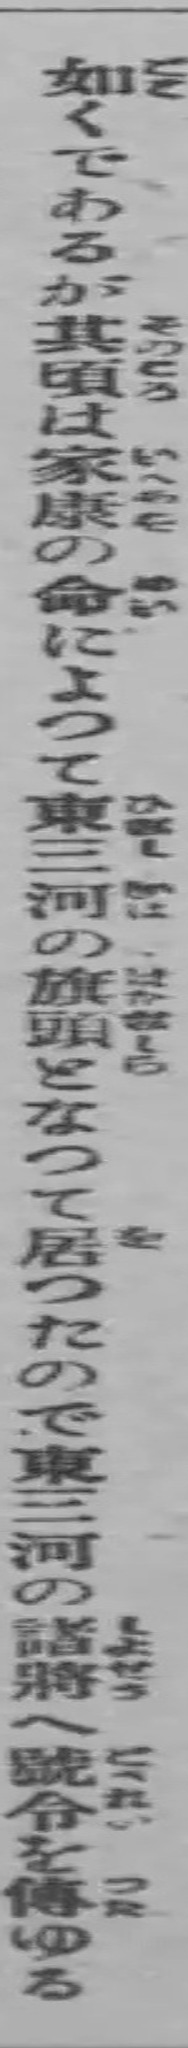如くであるが其頃は家康の命によつて東三河の旗頭となつて居つたので東三河の諸将へ号令を伝ゆる
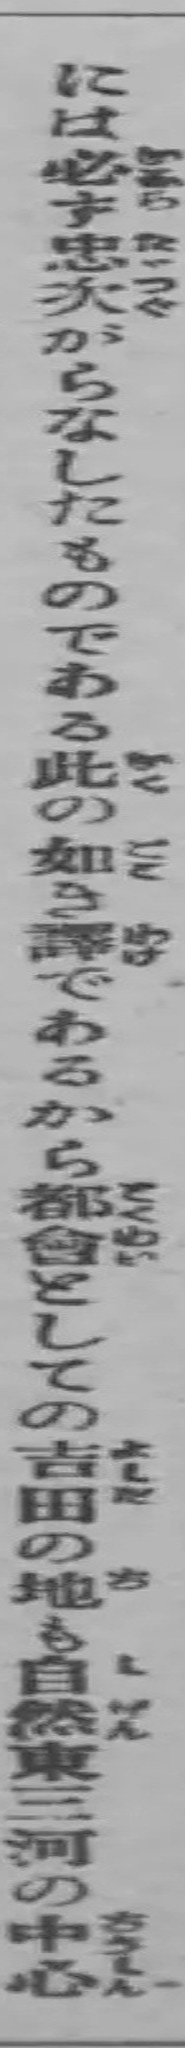には必ず忠次からなしたのである此の如き訳であるから都会としての吉田の地も自然東三河の中心
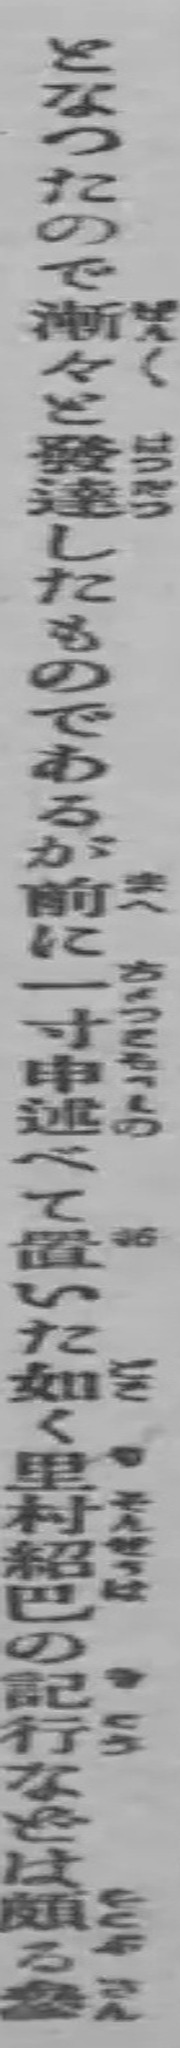となつたので漸々と発達したものであるが前に一寸申述べて置いた如く里村紹破巴の記行などは頗る参
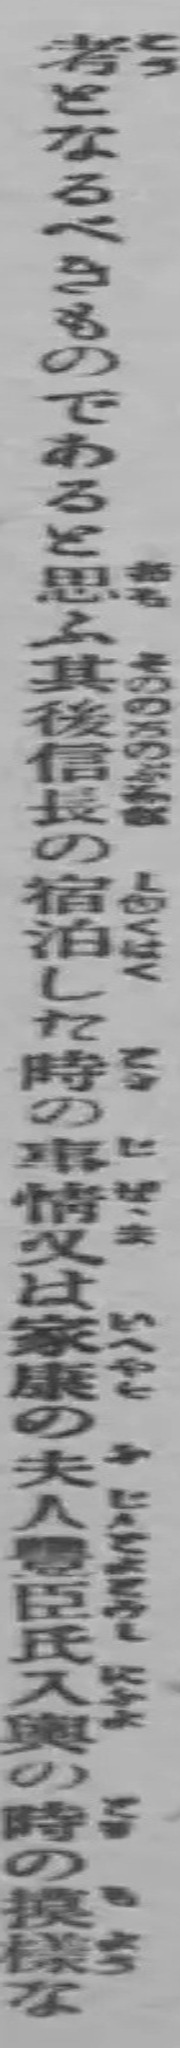考となるべきものであると思ふ其後信長の宿泊した時の事情又は家康の夫人豊臣氏入輿の時の模様な
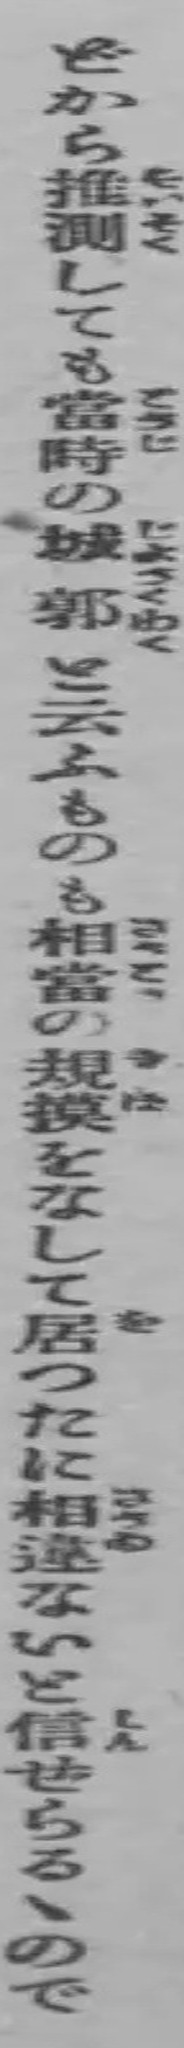どから推測しても当時の城郭と云ふものも相当の規模をなして居つたに相違ないと信ぜらるゝので
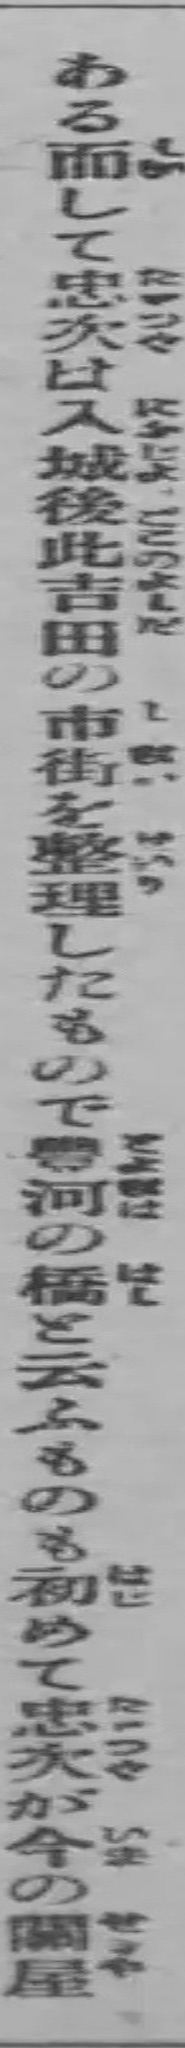ある而して忠次は入城後此吉田の市街を整理したもので豊河の橋と云ふものも初めて忠次が今の関屋
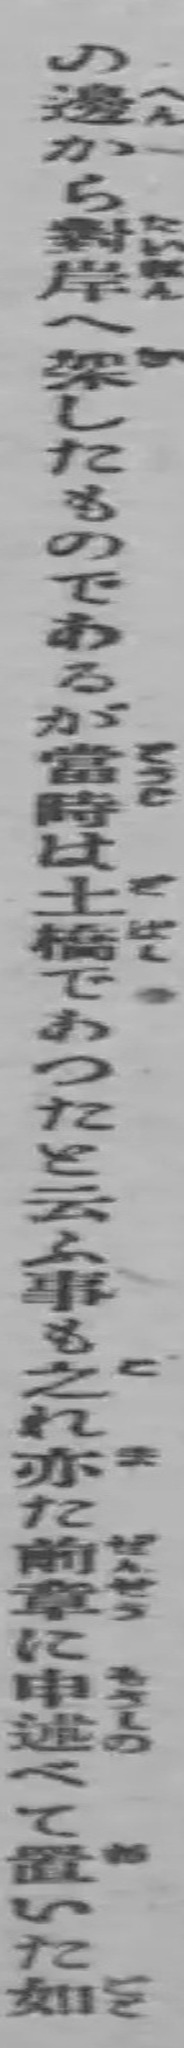の辺から対岸へ架したものであるが当時は土橋であつたと云ふ事も之れ亦た前章に申述べて置いた如
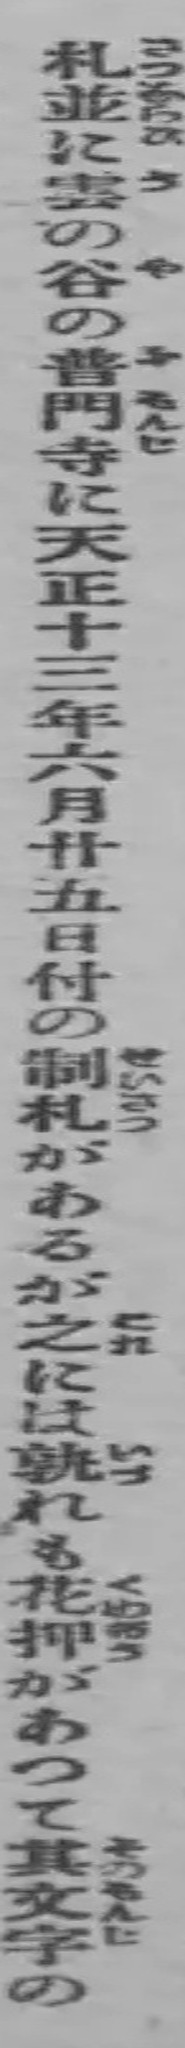普門寺文書札並に雲の谷の普門寺に天正十三年六月廿五日付の制札があるが之には孰れも花押があつて其文字の
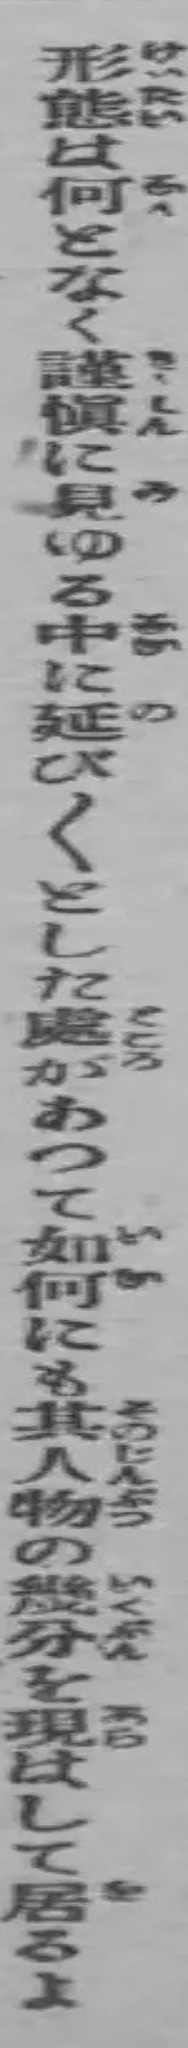形態は何となく謹慎に見ゆる中に延び〳〵とした処があつて如何にも其人物の幾分を現はして居るよ
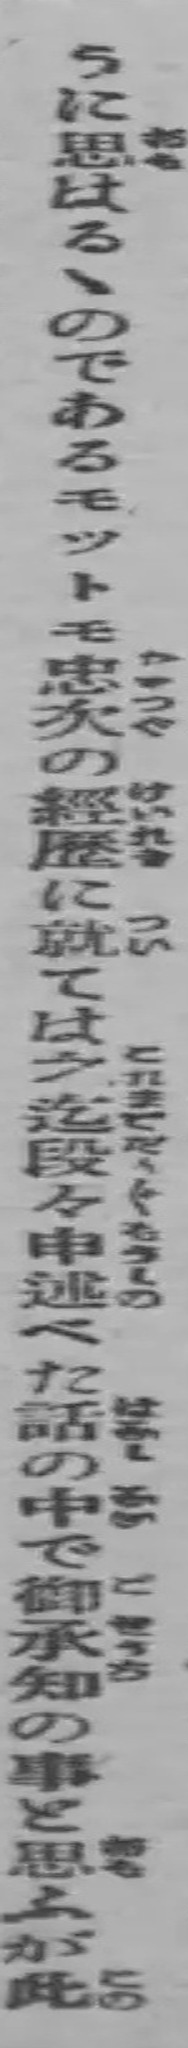うに思はるゝのであるモツトモ忠次の経歴に就ては之迄段々申述べた話の中で御承知の事と思ふが此
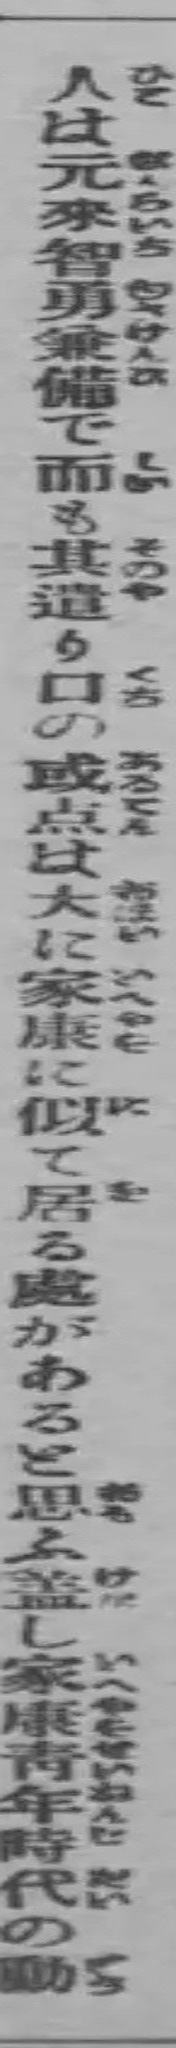忠次と家康人は元来智勇兼備で而も其遣り口の或点は大に家康に似て居る処があると思ふ蓋し家康青年時代の動
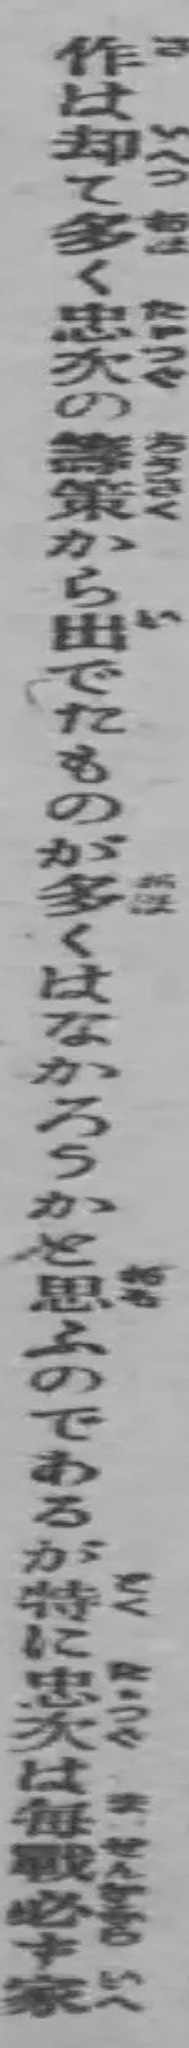作は却て多く忠次の謀策から出でたものが多くはなかろうかと思ふのであるが特に忠次は毎戦必ず家
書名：豊橋市史談
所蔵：国立国会図書館 National Diet Library, JAPAN
